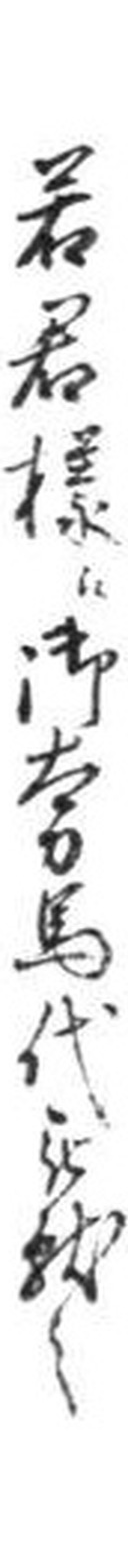若君様江御太刀馬代被献之
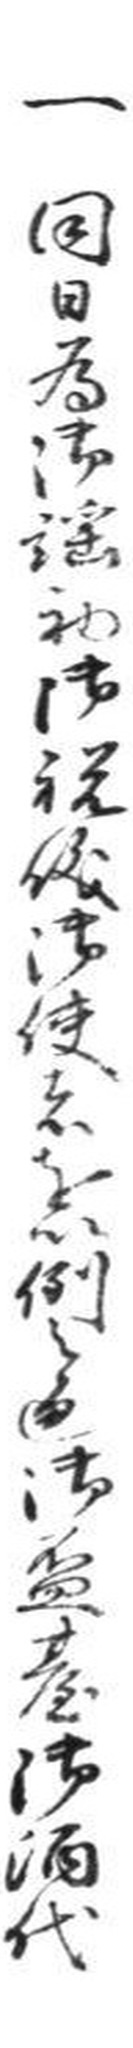一同日為御謡初御祝儀御使者を以例之通御盃台御酒代
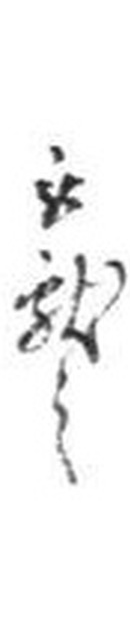被献之
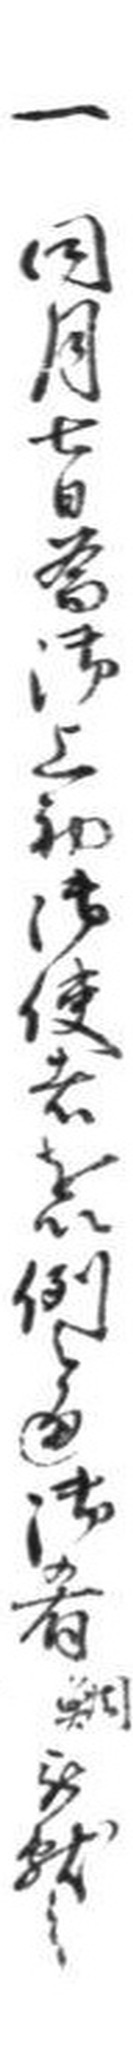一同月七日為御上初御使者を以例之通御肴鯛被献之
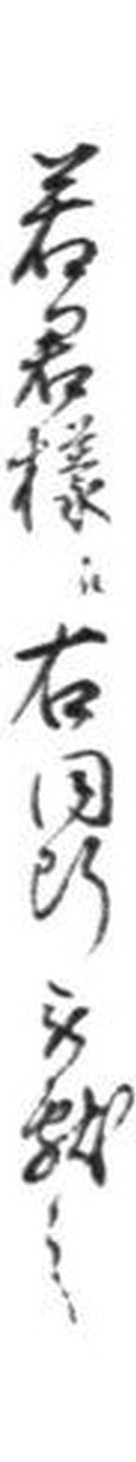若君様江右同断被献之
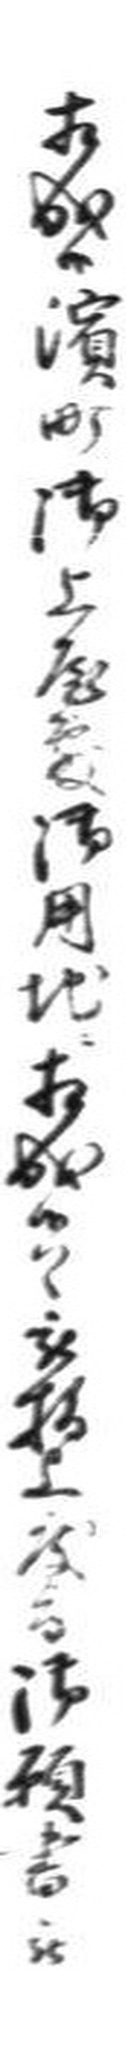相成候浜町御上屋敷御用地ニ相成候ハヽ被指上度旨御願書被
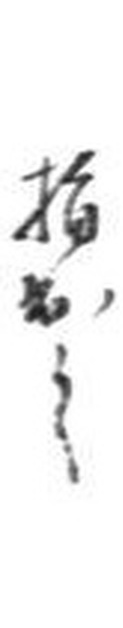指出之
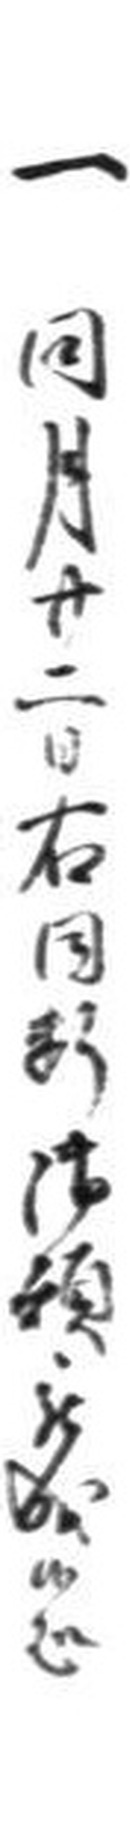一同月廿二日右同断御願被成候処
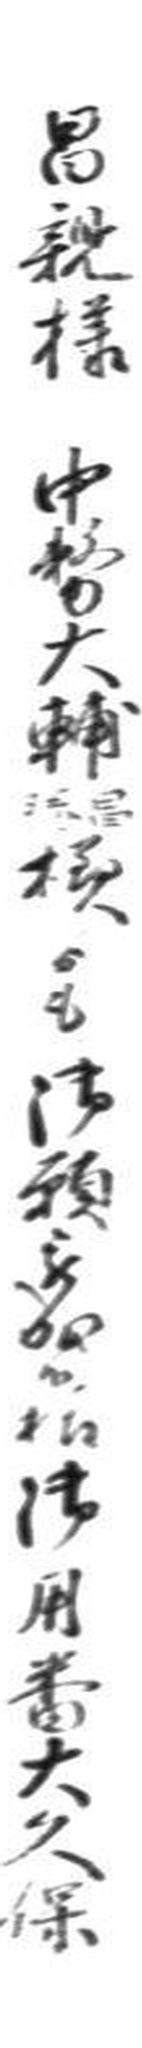昌親様中務大輔昌勝様ゟも御願被成候様御用番大久保
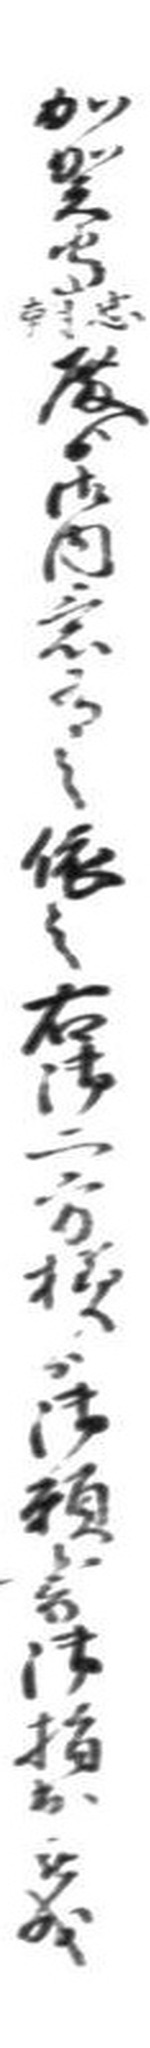加賀守忠朝殿ゟ御内意有之依之右御二方様ゟ御願書御指出被成
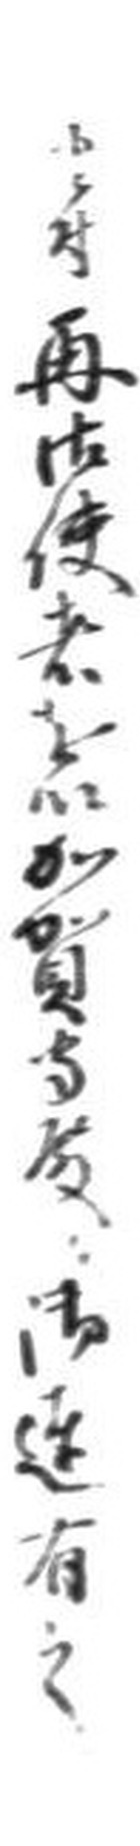候ニ付再御使者を以加賀守殿江御達有之
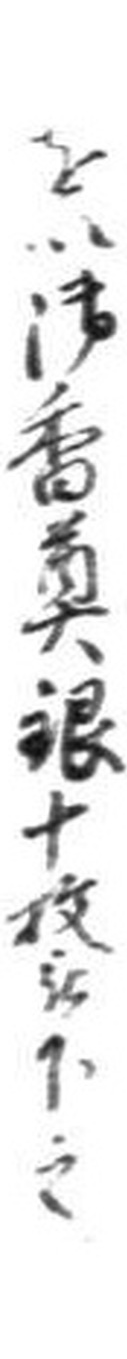を以御香奠銀十枚被下之
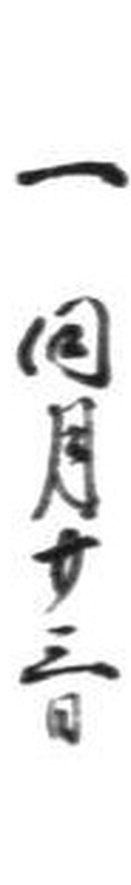一同月廿三日

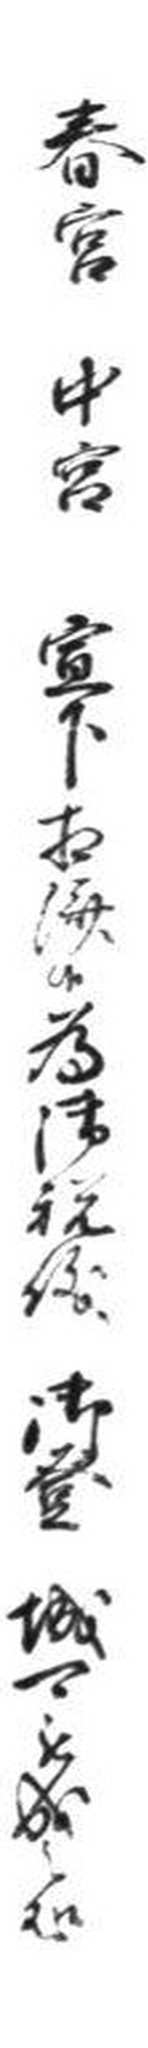春宮中宮宣下相済候為御祝儀御登城可被成之処
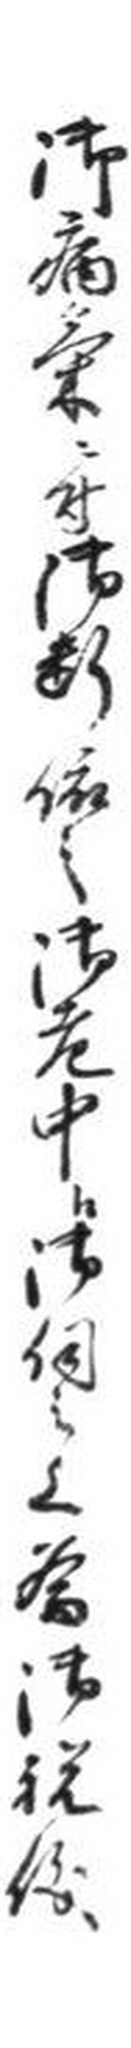御病気ニ付御断依之御老中江御伺之上為御祝儀
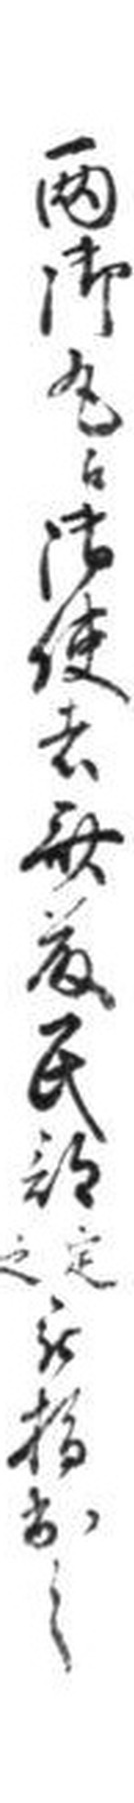両御丸江御使者斎藤民部定之被指出之
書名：家譜 十五 綱昌公 従天和元年到元禄十二年
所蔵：福井県文書館 Fukui Prefectural Archives
